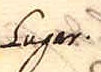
Lugar.
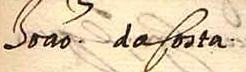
Joaõ. da Costa.
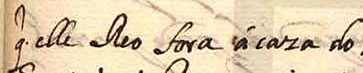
q̄. elle Reo fora á caza do
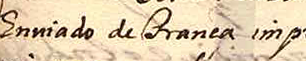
Enuiado de França impri
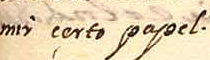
mir çerto papel.
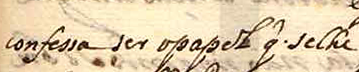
confessa ser o papel q̄. se lhe
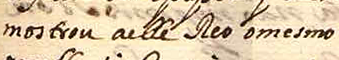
mostrou a elle Reo o mesmo
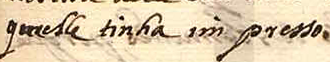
que elle tinha impresso
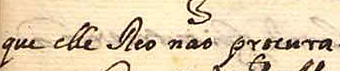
que elle Reo não procura
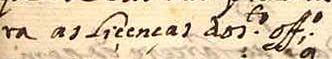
ra as Liçenças do s.to off.o,
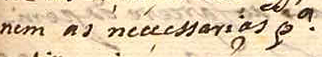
nem as necçessarias pa.
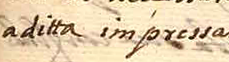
a ditta impressaõ.
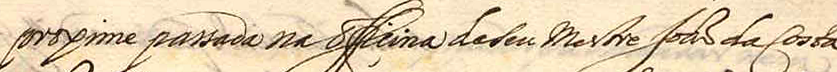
proxime passada na offiçina de seu mestre João da Costa
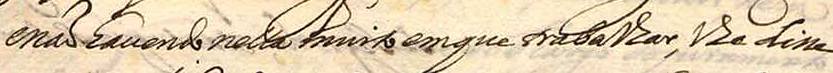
e não hauendo nada muito em que trabalhar, lhe disse
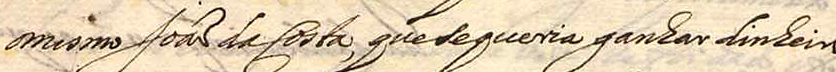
o mesmo João da Costa, que se queria ganhar dinheiro
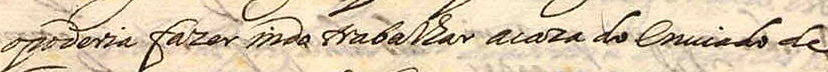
o poderia fazer indo trabalhar a caza do Enuiado de
